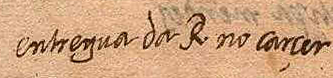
entregua da R. no carçer
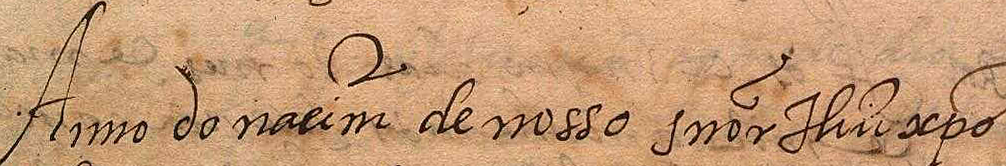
Anno do nacimto de nosso sno̅r Jhu̅ xp̅o
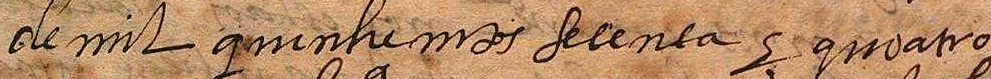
de miL quinhemtos secenta E quoatro
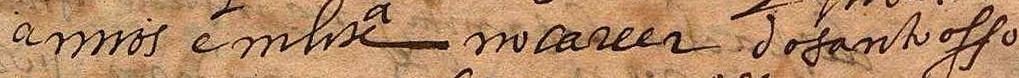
annos em lixa no carcer do santo offo
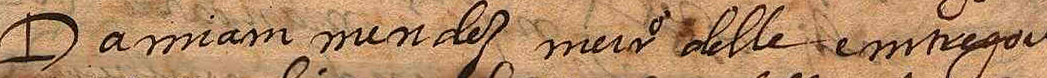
Damiam mendez meiro delle emtregou
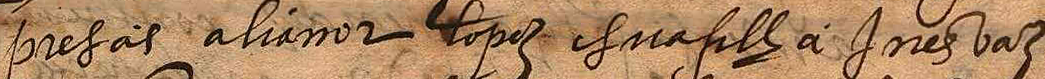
presas a lianor lopez e sua filha Jnes vaz
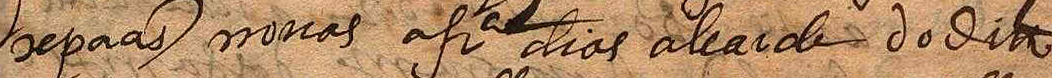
xpaa̅s nouas a frco dias alcaide do ditto
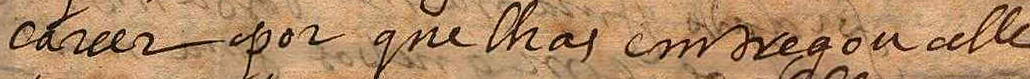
carcer e porque lhas emtregou e elle
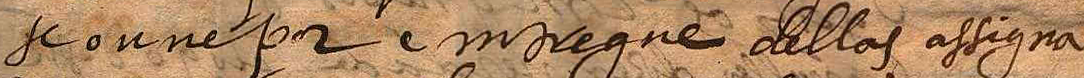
se ouue por emtregue dellas assigna
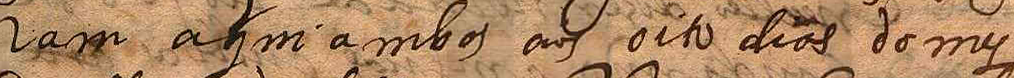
ram aqui ambos aos oito dias do mes
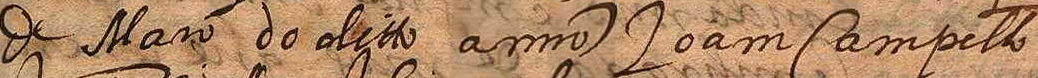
de Maio do ditto anno̅ Joam Campello
